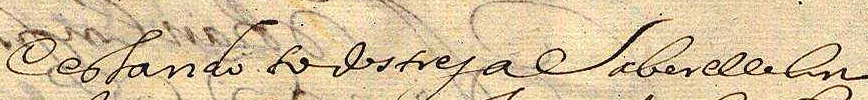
e estando todos tres a Saber elle Con
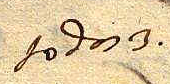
todos 3.
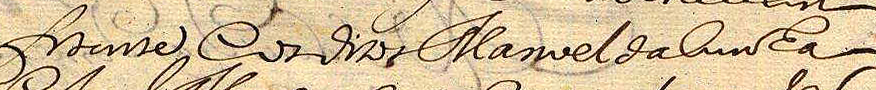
fitente, e os ditos Manoel da Cunha
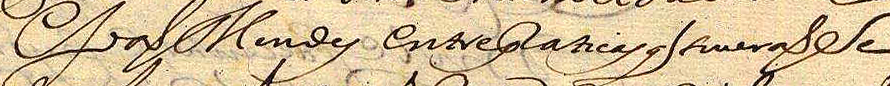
E Joaõ Mendes entre pRaticas q̄ tiueraõ Se
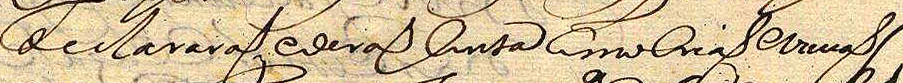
declararaõ, e deraõ Conta como criaõ e viuiaõ
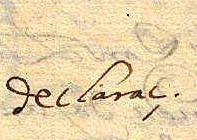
declaraç.
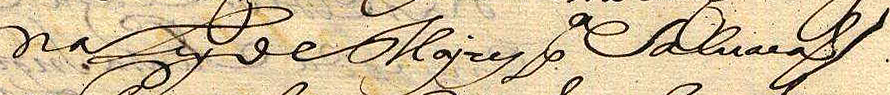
na Ley de Moyzes pa Saluaçaõ
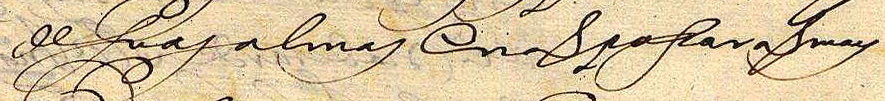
de suas almas e naõ passaraõ mais
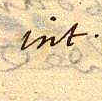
int.
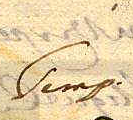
Temp.
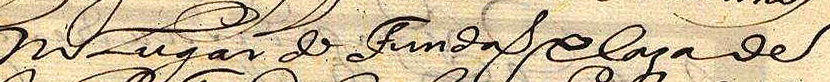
no Lugar do Fundaõ e Caza de
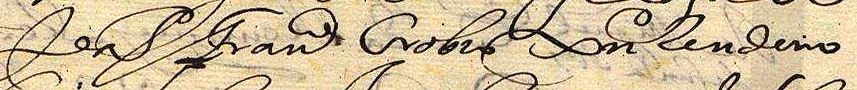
Joaõ Fran.co Crobio xn Rendeiro
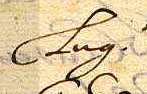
Lug.
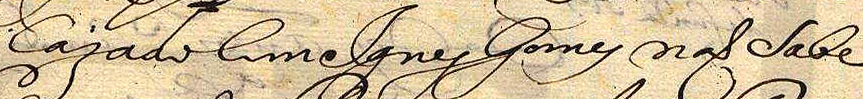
Cazado Com Ignes Gomes naõ Sabe
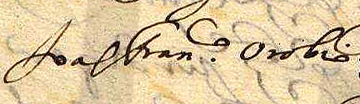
Joaõ Fran.co o robio.
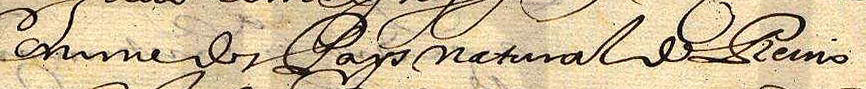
o nome dos Pays natural do Reino
